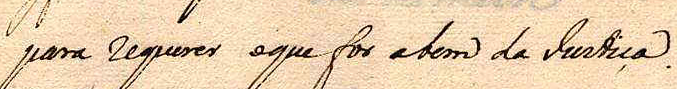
para requerer e que for a bem da Iustiça.
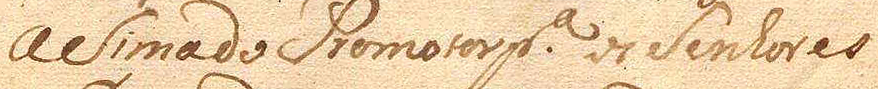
aSima do Promotor p.a os Senhores
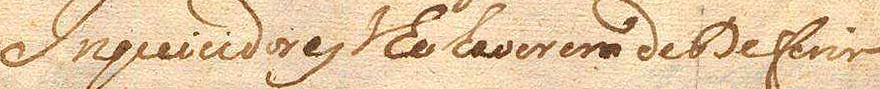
Inquisidores lhe haverem de Deferir
